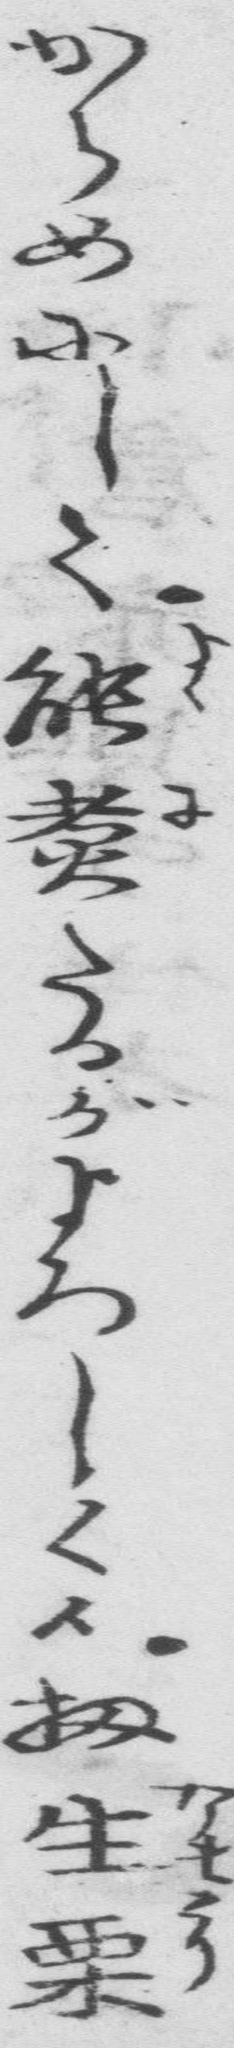からめにして。能煮たるがよろしく候。扨生栗
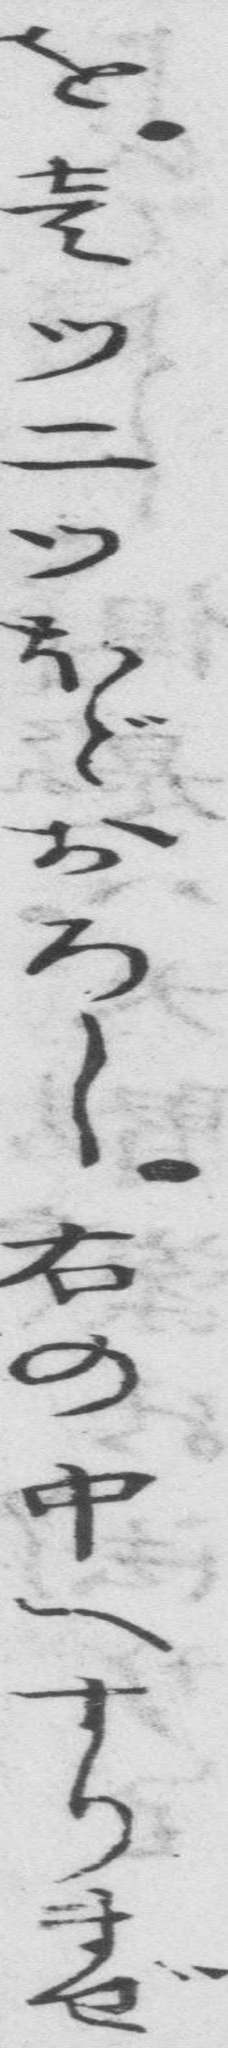を。壱ツ二ツほどおろし。右の中へすりまぜ

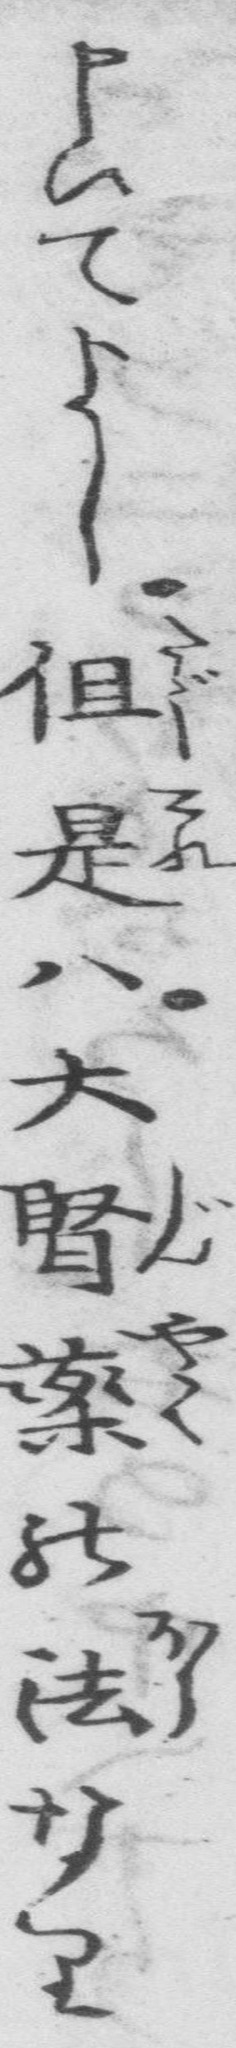申候てよし。但是は。大腎薬の法なり
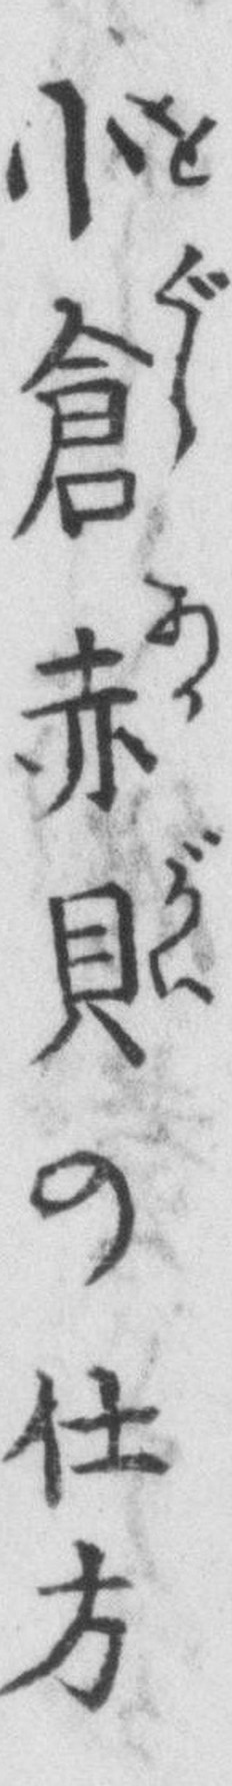小倉赤貝の仕方
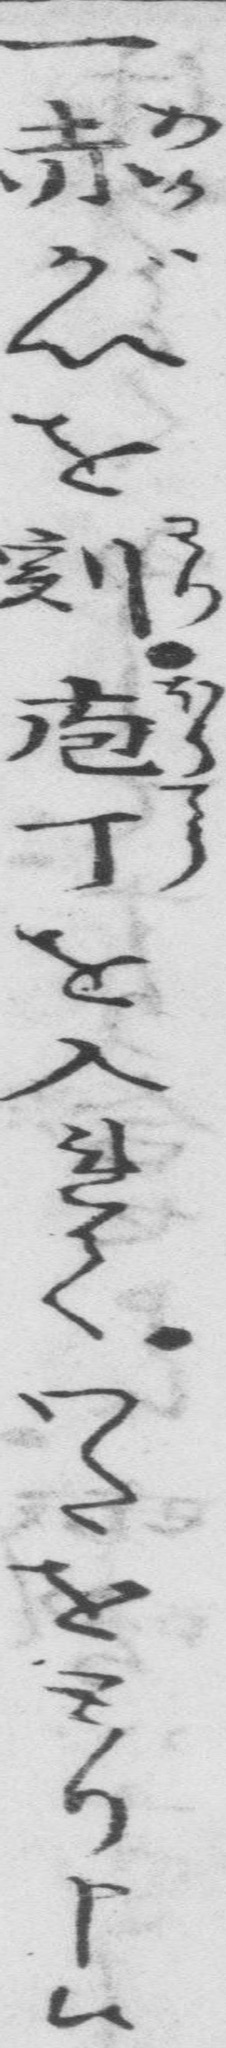一赤がいを割。包丁を入れて。わたをとり申候
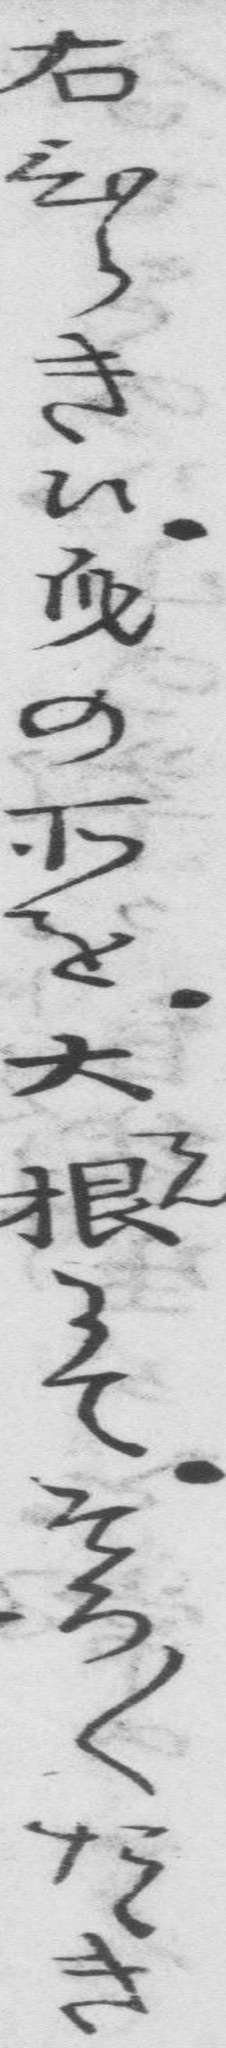右ひらき候。身の所を。大根にて。そろ〳〵たゝき
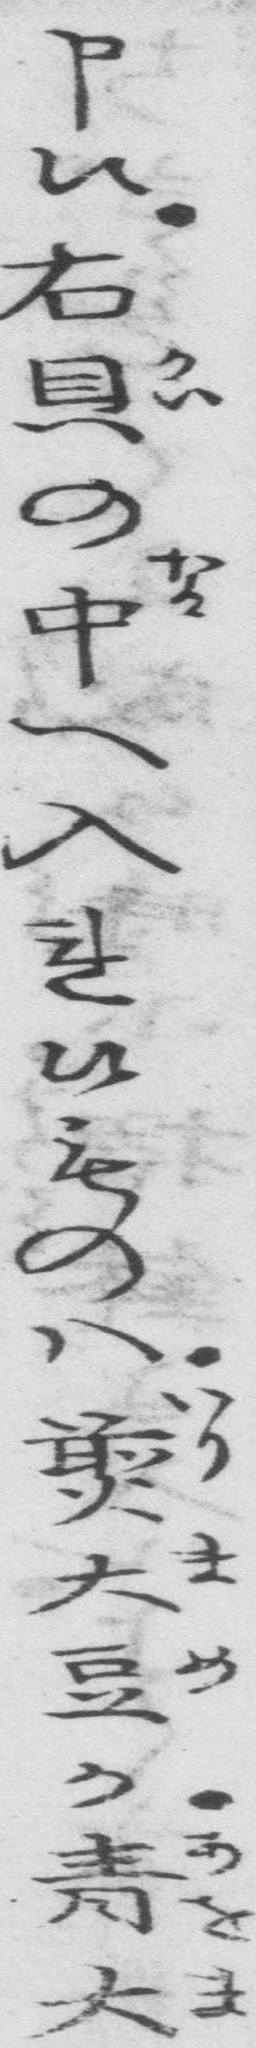申候。右貝の中へ入れ候ものは。煎大豆か。青大
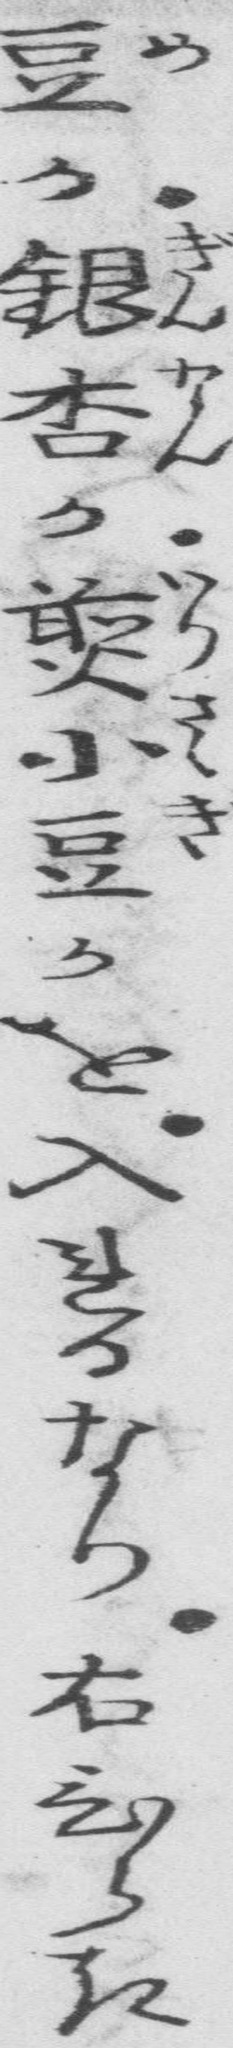豆か。銀杏か。煎小豆かを。入れるなり。右ひらき
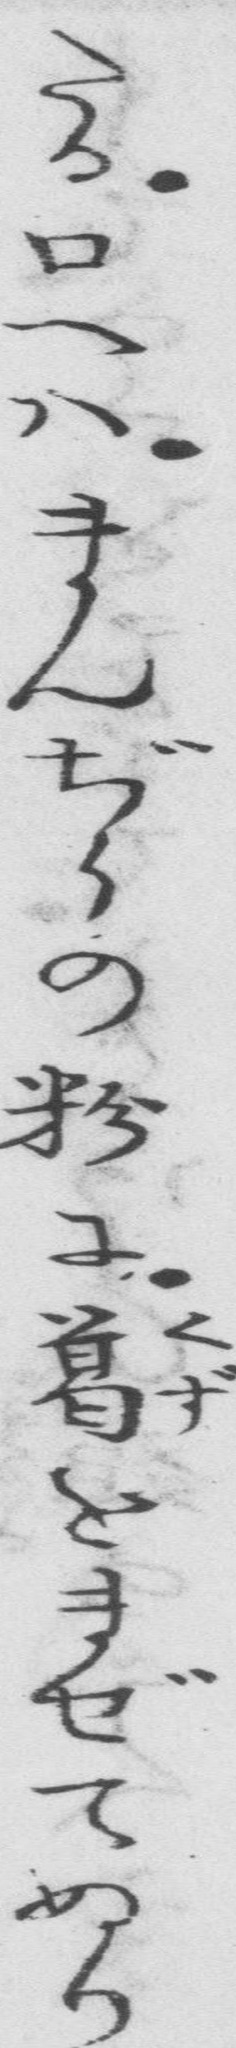たる。口へは。まんぢうの粉に、葛をまぜてぬり
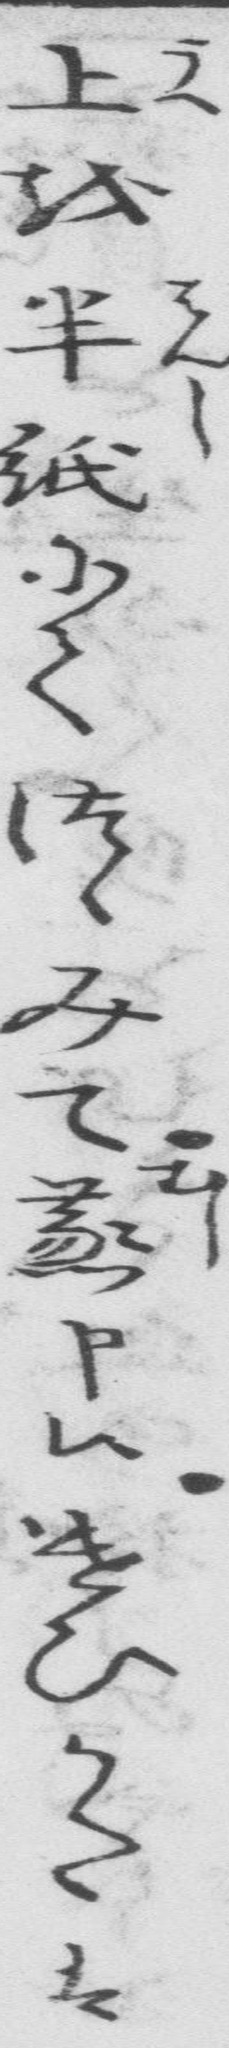上を半紙にてつゝみて。蒸申候。遣ひかたは
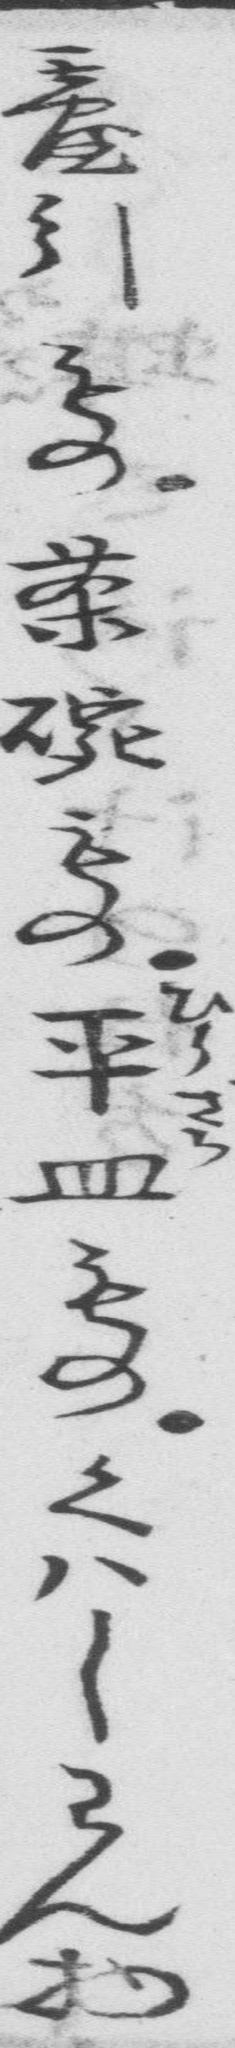台引もの。茶碗もの。平皿もの。くはしわん物
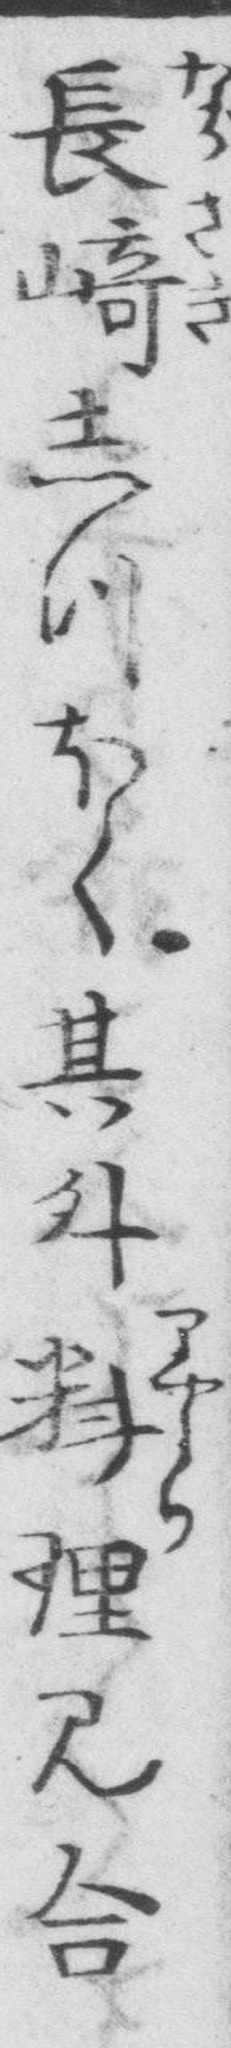長崎しつほく。其外料理見合
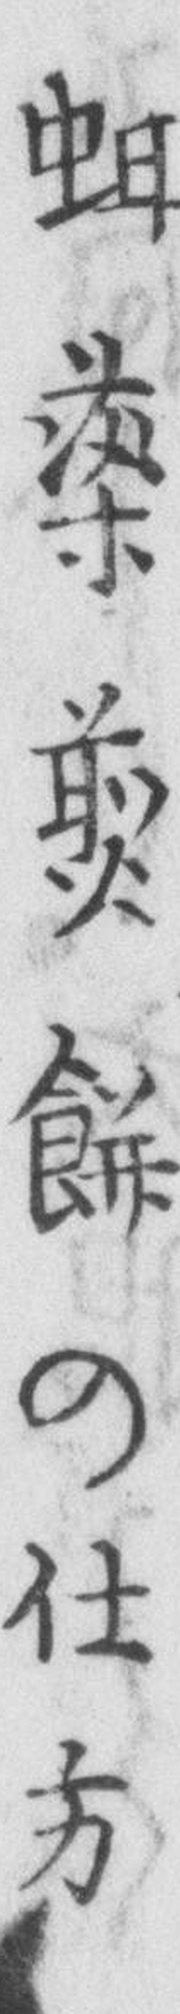蚶薬煎餅の仕方
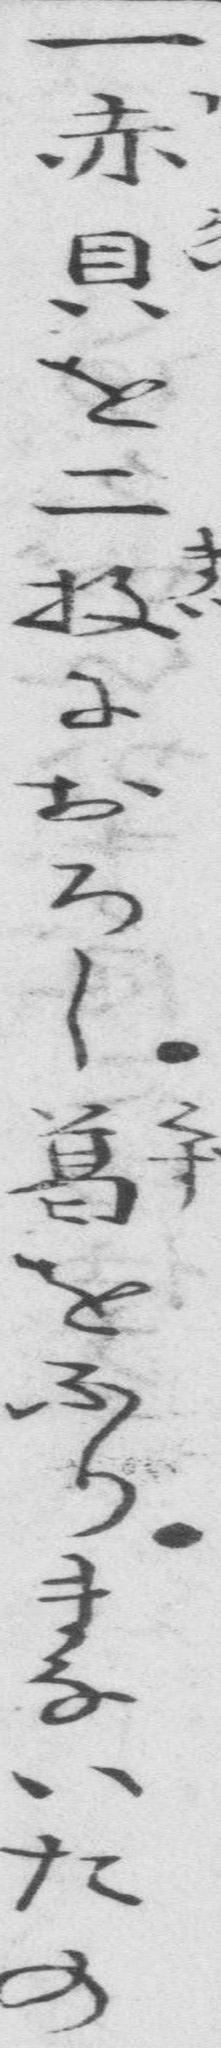一赤貝を二枚おろし。葛をふり。まないたの
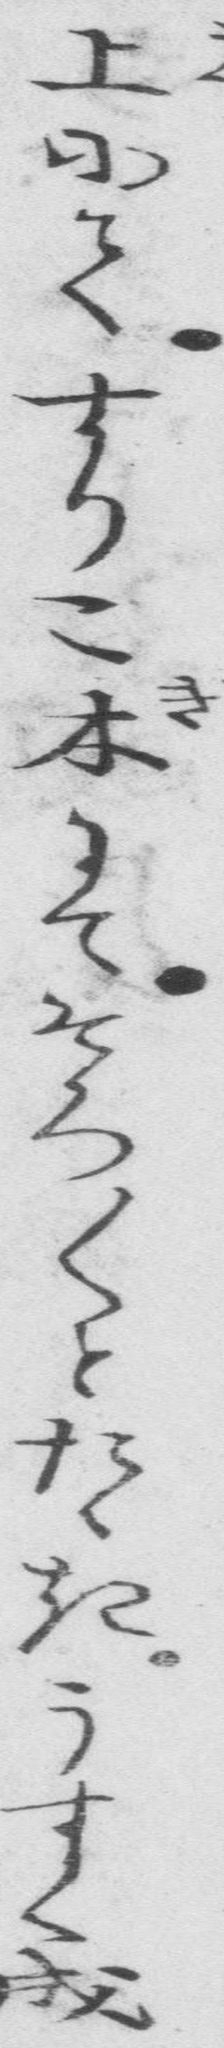上にて。すりこ木にて。そろ〳〵とたゝき。うすく成
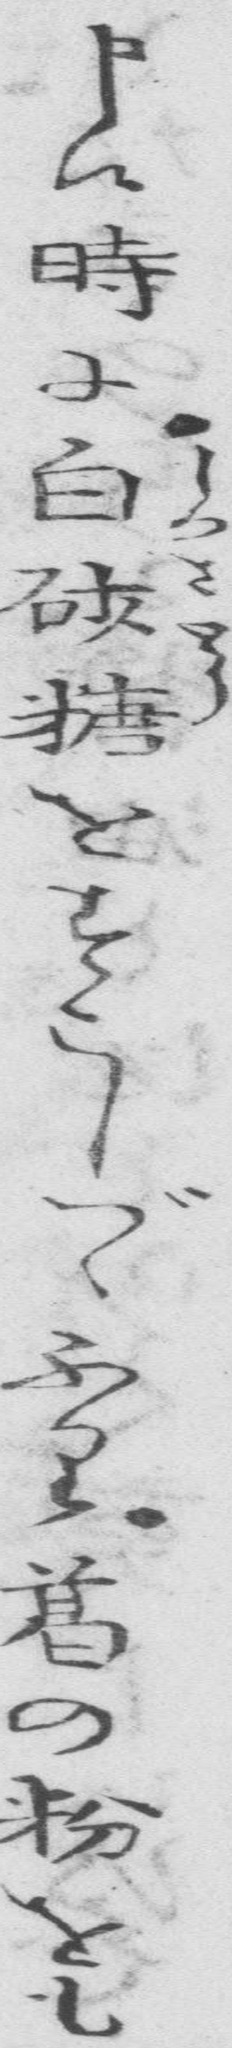申候時に。白砂糖をすこしづゝふり。葛の粉をも
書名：萬寳料理秘密箱
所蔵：大阪府立大学学術情報センター 国文学研究資料館
